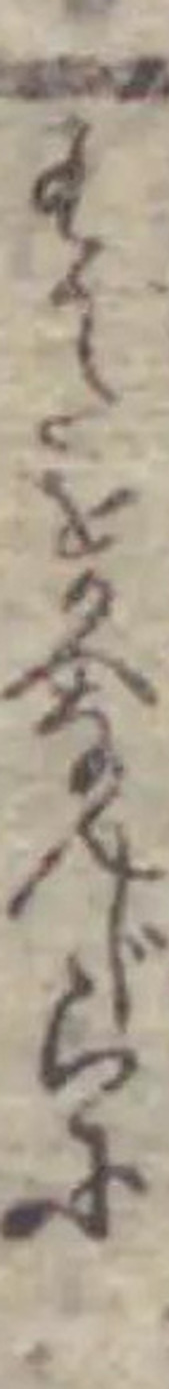すがたをかへなんじらに
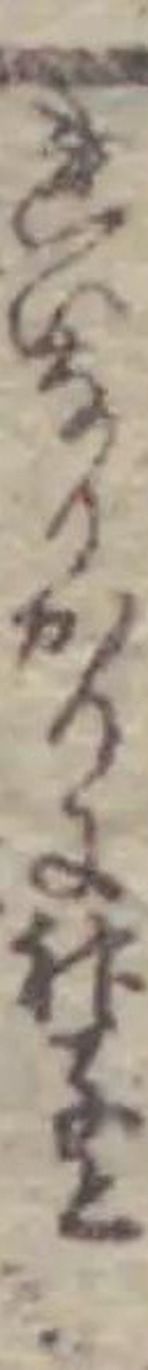れいなりかりに神子と
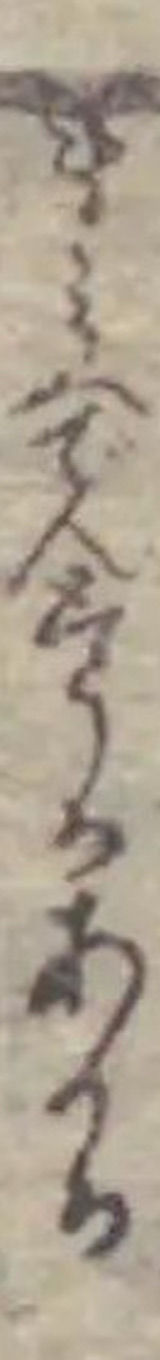まみへでんとうかありか
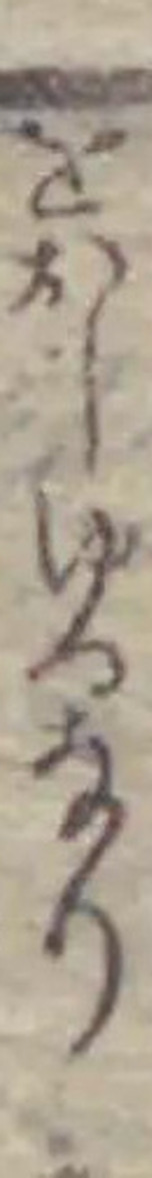をおしゆるなり
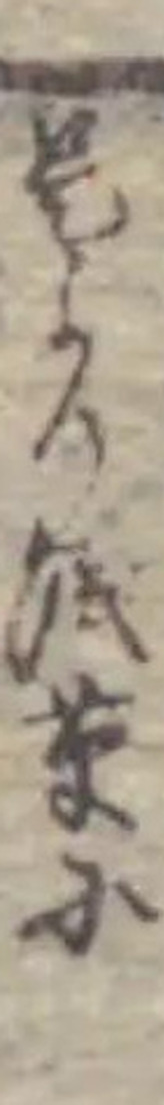是より浅草に
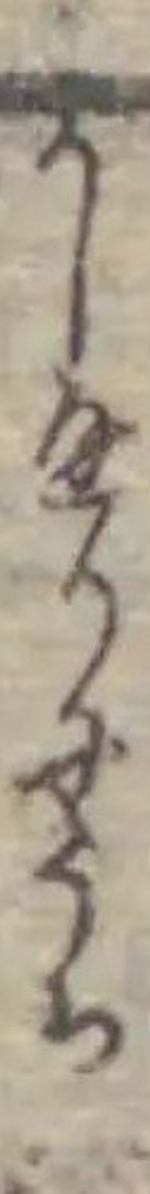かし辺りにうか
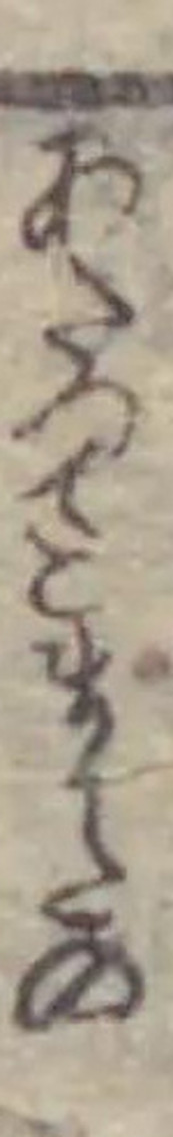あたつてこまかたの
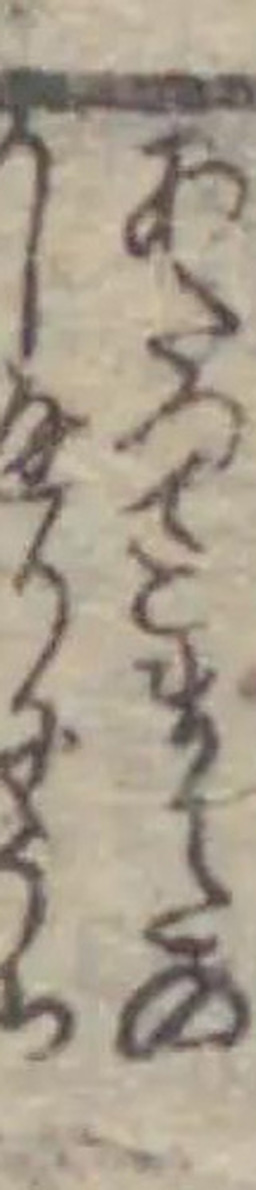かし辺りにうか
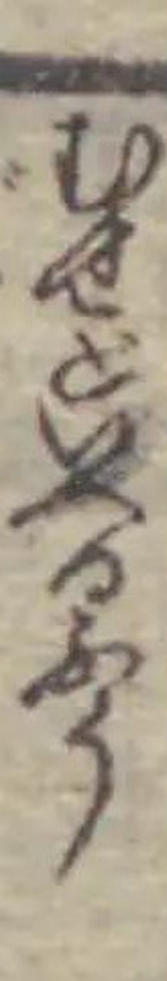むせといへるふう
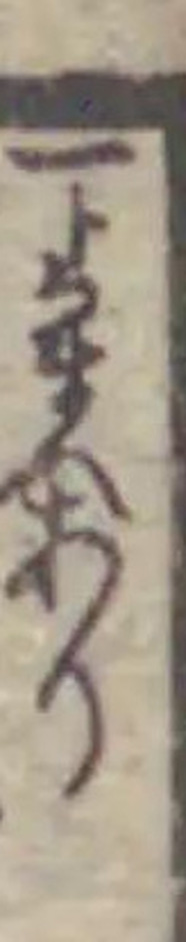一トかまへあり
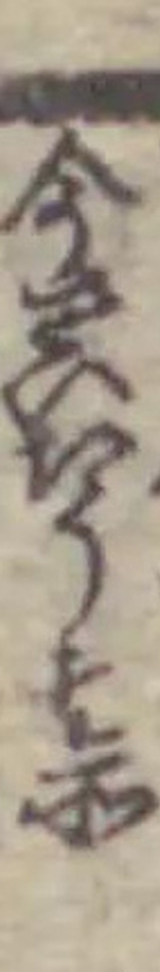今さいちう其所
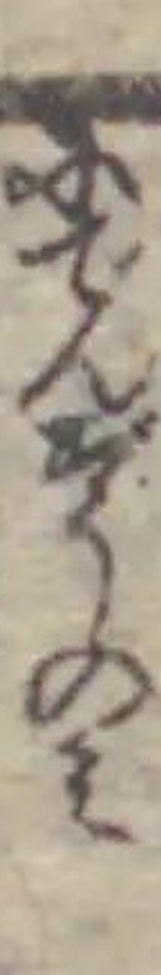にでんどうのみ
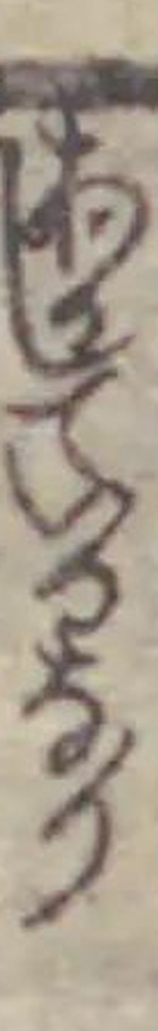あかしているなり
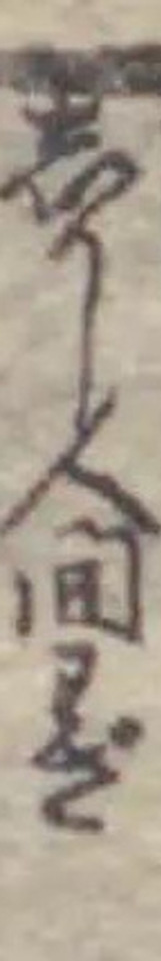しかし人間わざ
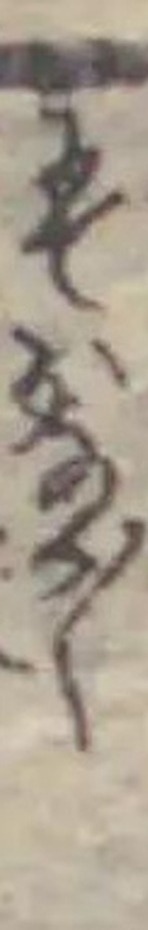にてはなか〳〵
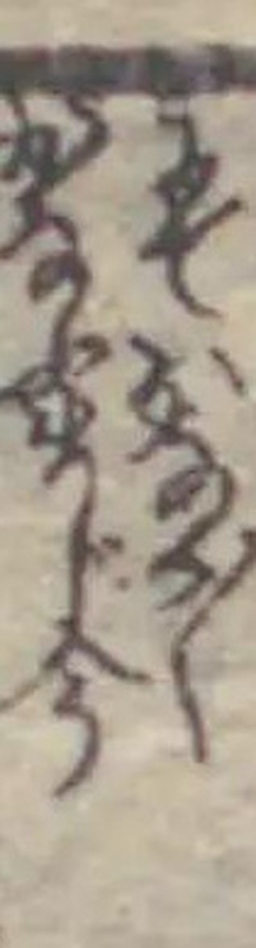かなふまじ今
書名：藝者五人娘 2巻
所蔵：国立国会図書館 National Diet Library, JAPAN
